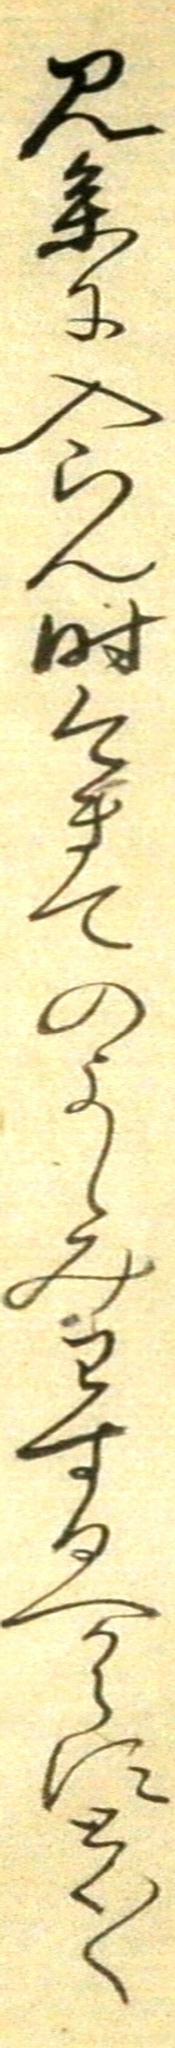見参に入らん時今まてのよしみわするへからすとく〳〵
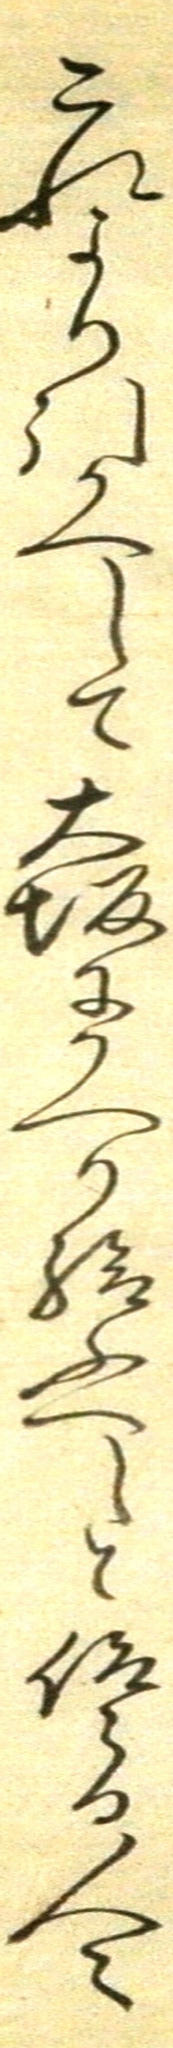これより引かへして大坂にかへり給ふへしと仰らる人々
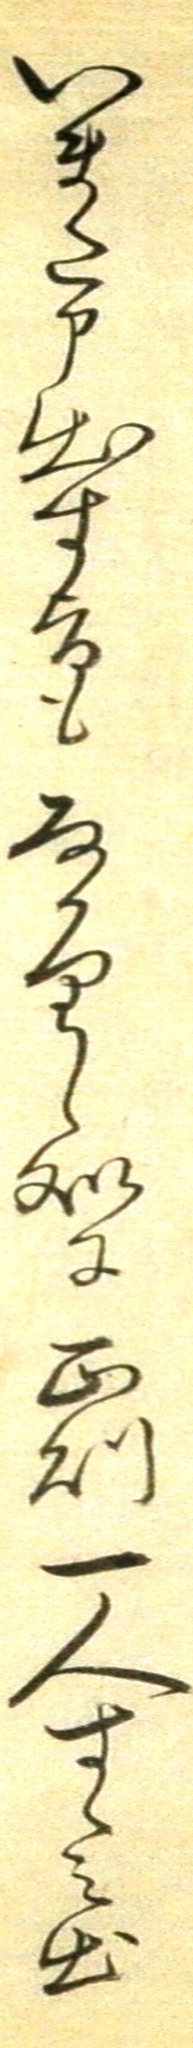いまた申出す旨もなかりし処に正則一人すゝみ出
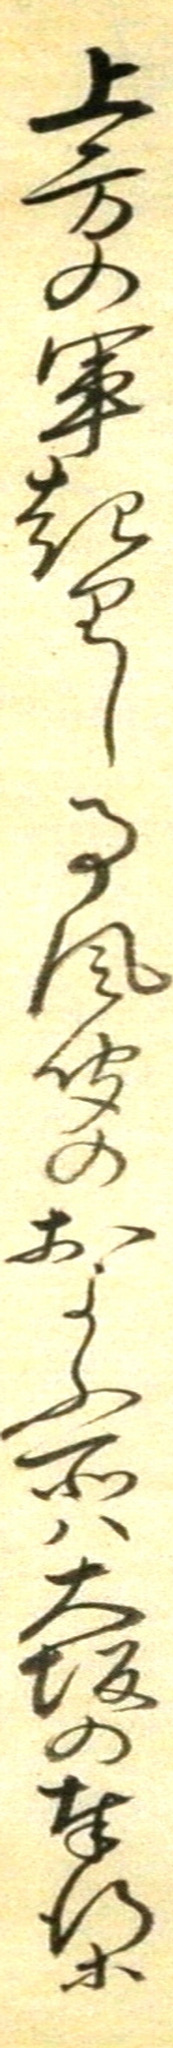上方の軍起りし事風聞のおよふ所は大坂の奉行等
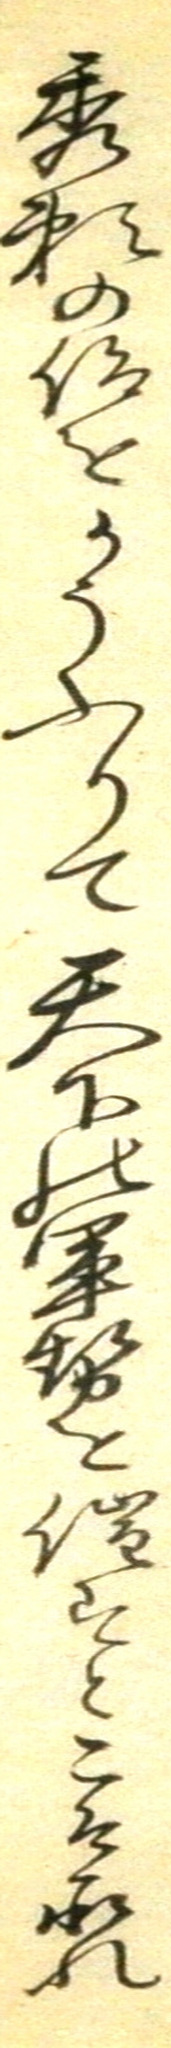秀頼の仰をかうふりて天下の軍勢を催すとこそ承れ
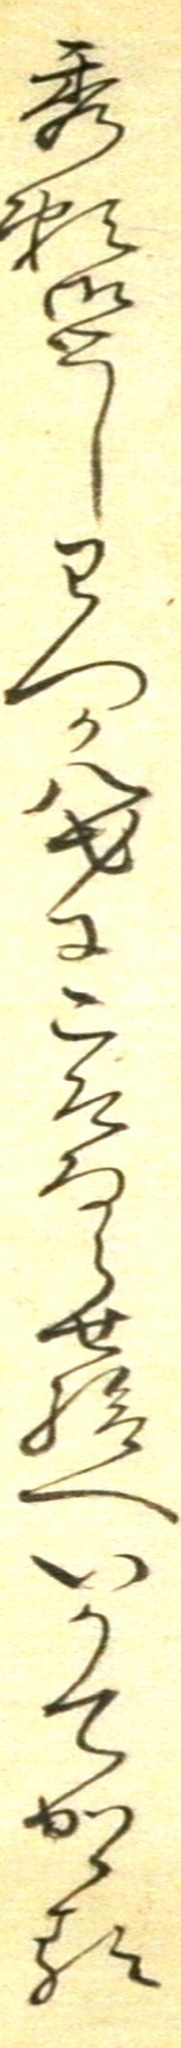秀頼御としわつか八才にこそならせ給へいかてかゝる
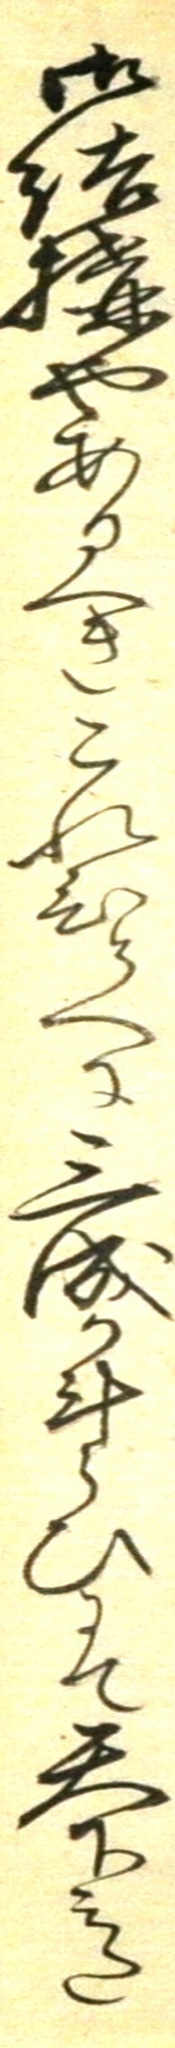御結構やあるへきこれひとへに三成か計らひにて天下のた
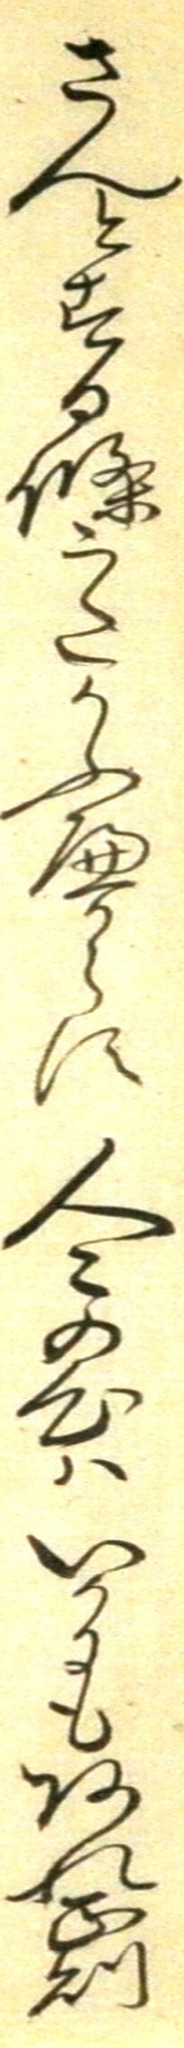さんとする條々たかふへからす人々の心はいかにもあれ正則
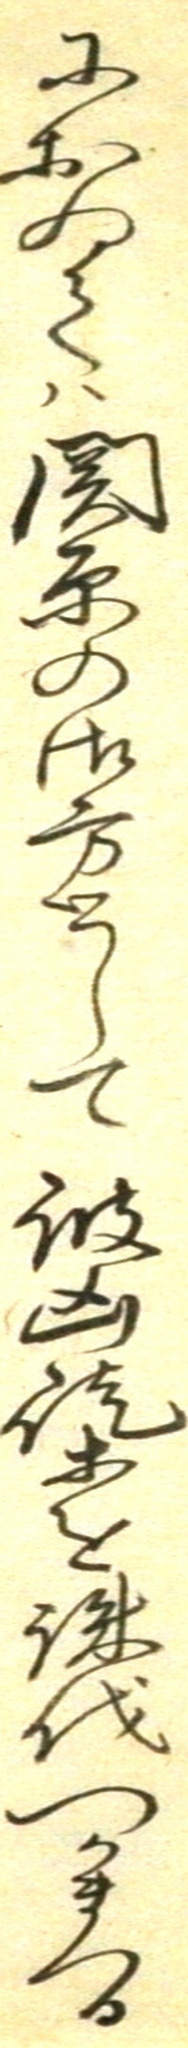におゐては関東の御方として彼凶徒等を誅伐つかまつる
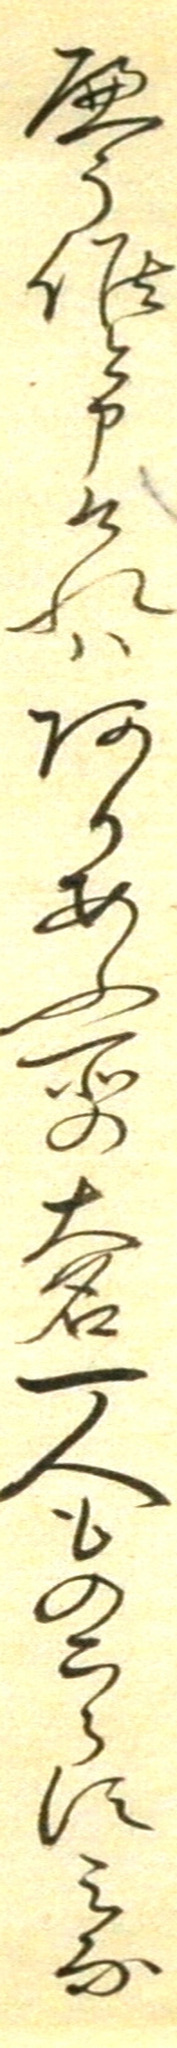へう候と申けれはありあふ所の大名一人ものとらすみな
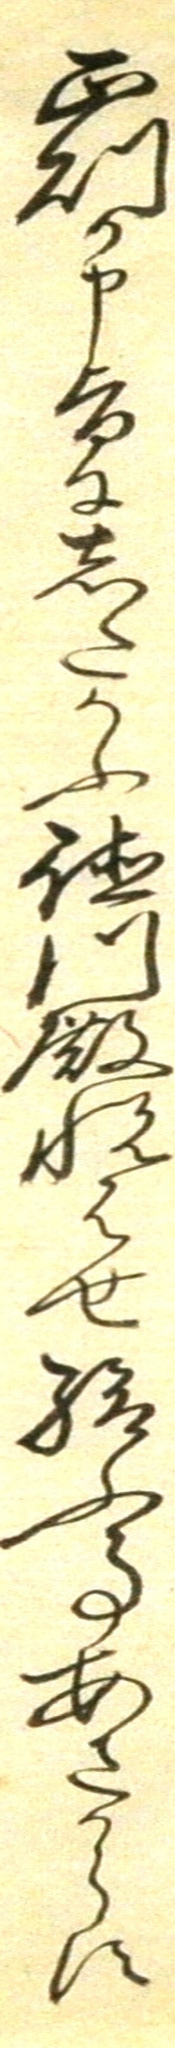正則か申旨にしたかふ徳川殿悦はせ給ふ事あたからす
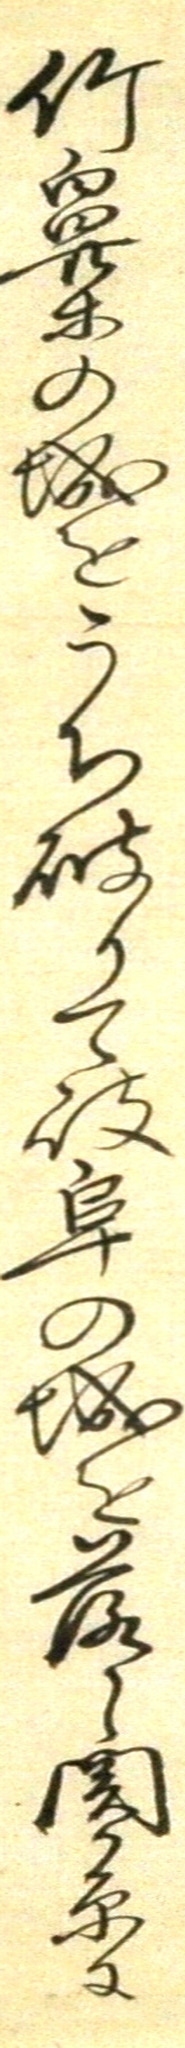竹鼻等の城をうち破りて岐阜の城を落し関東に
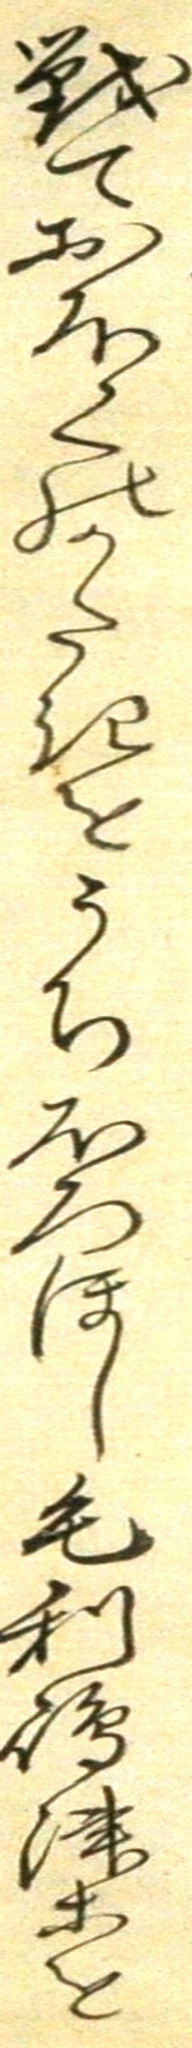戦ておほくのかたきをうちほろほし毛利嶋津等を
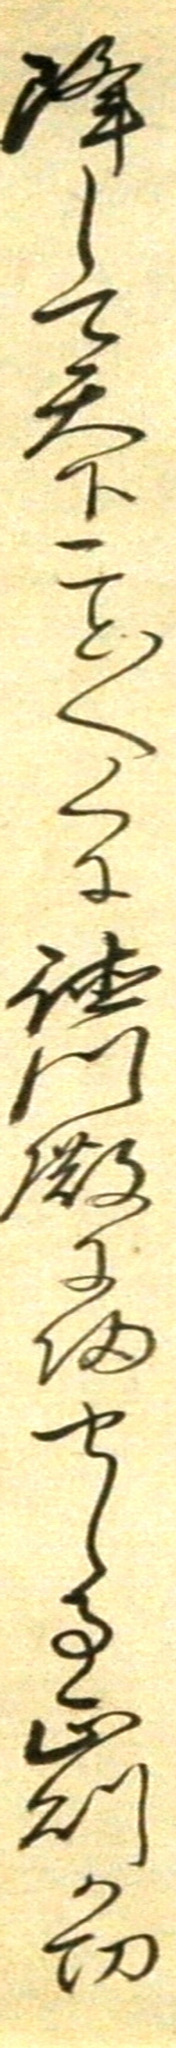降して天下こと〳〵くに徳川殿に帰せし事正則か功
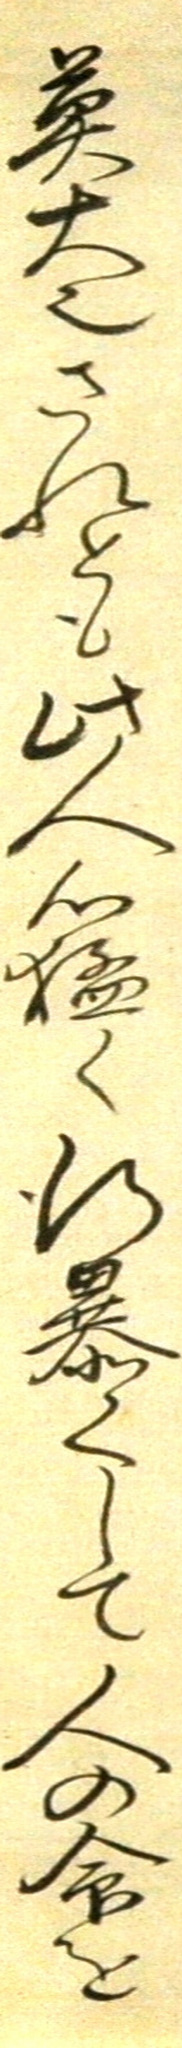莫大也されとも此人心猛く行暴くして人の命を
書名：藩翰譜（十二・上）
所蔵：伊那市立高遠町図書館・合同会社AMANE
